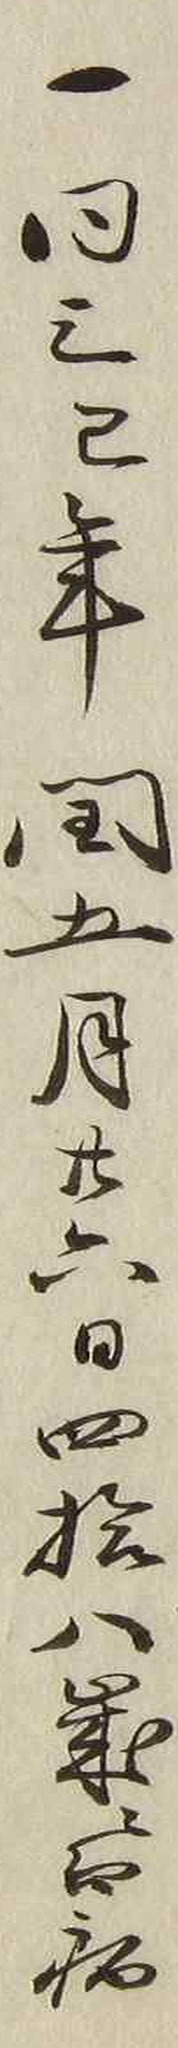一同三巳年閏五月廿六日四拾八歳に而病
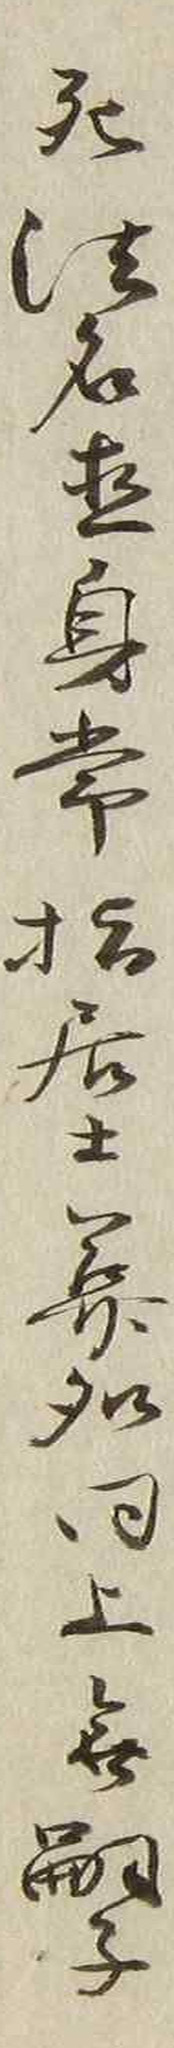死法名直身常指居士葬処同上無嗣子

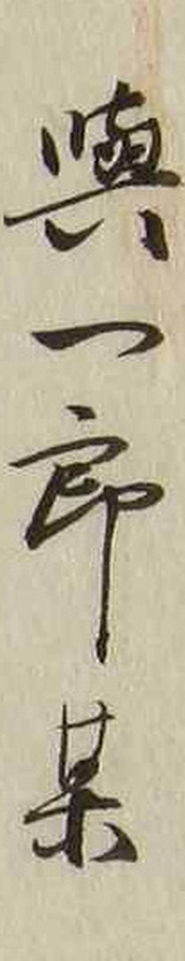与一郎某
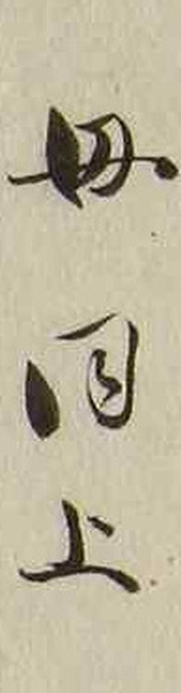母同上
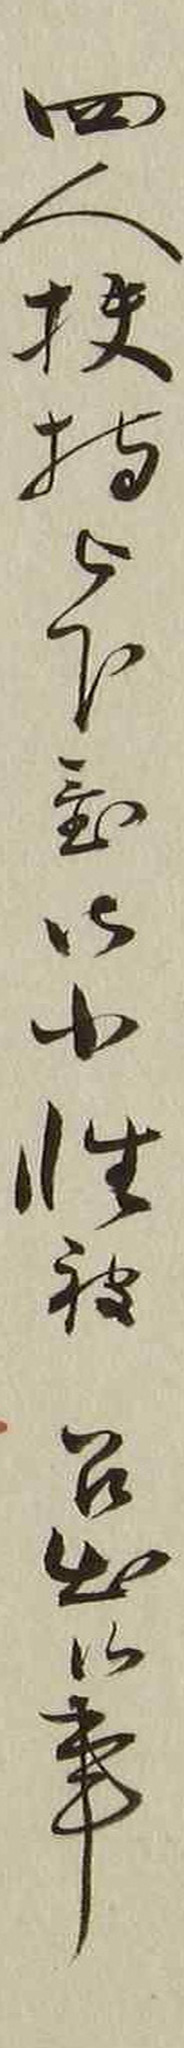四人扶持被下置御小性被召出候事
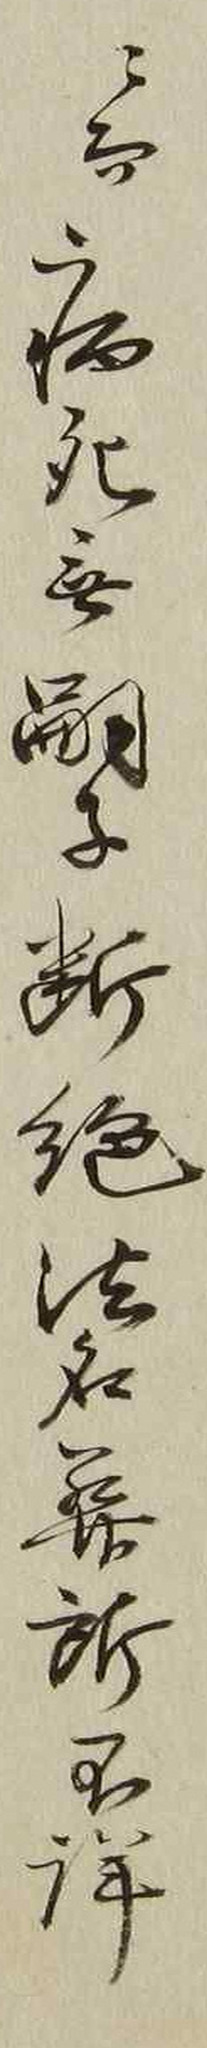に而病死無嗣子断絶法名葬所不詳
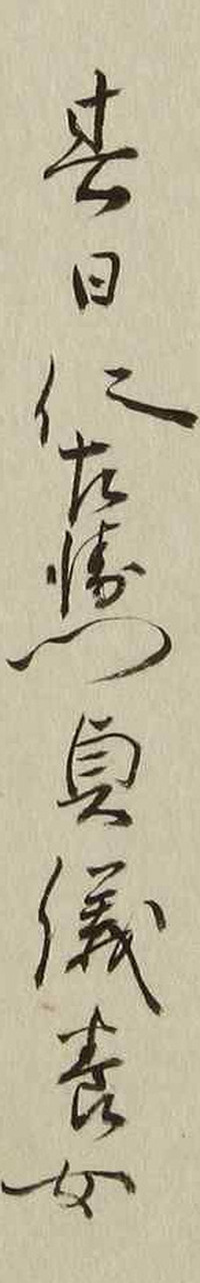女春日仁左衛門貞儀養女
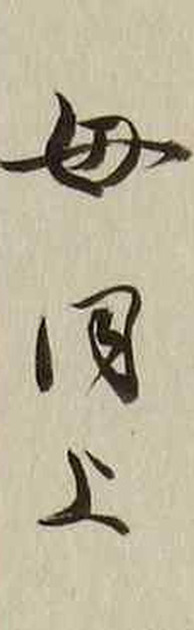母同上
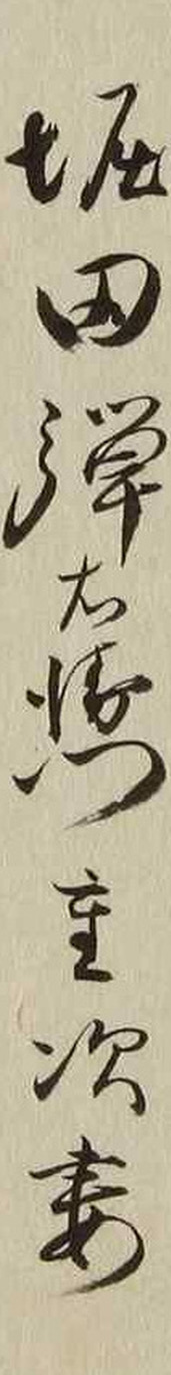女堀田弾右衛門重次妻
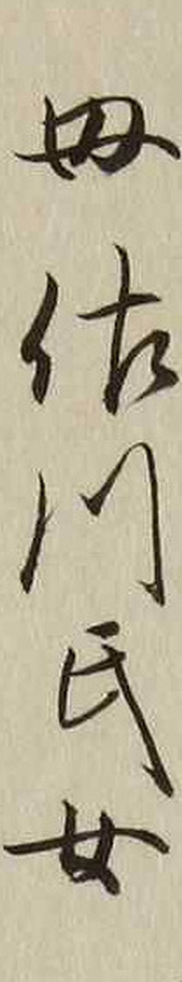母佐川氏女
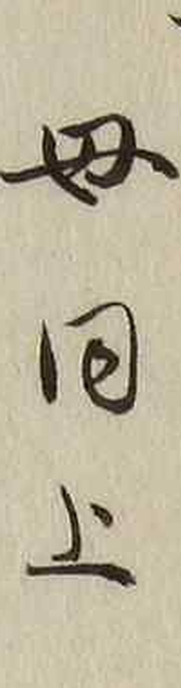母同上
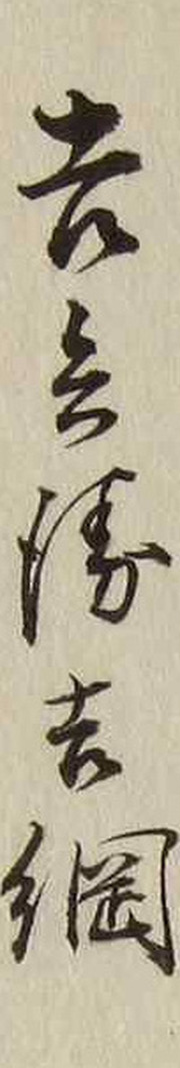吉兵衛吉綱
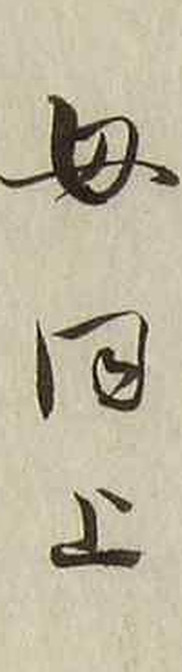母同上
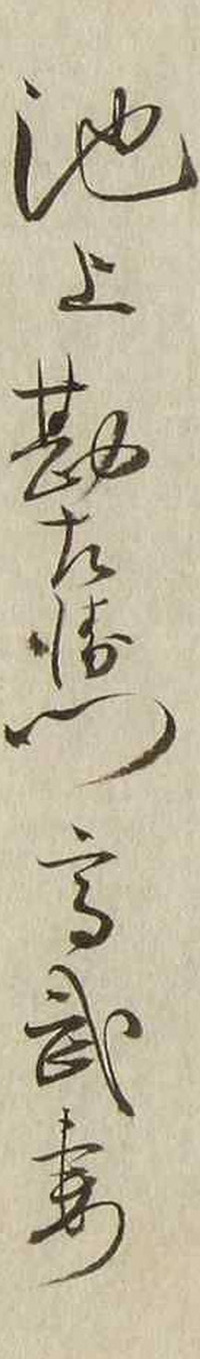女池上勘左衛門高武妻
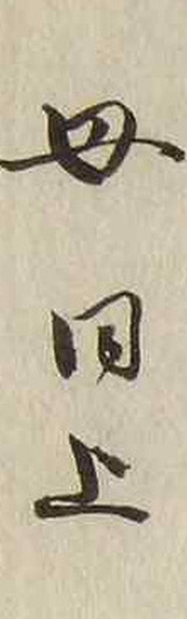母同上

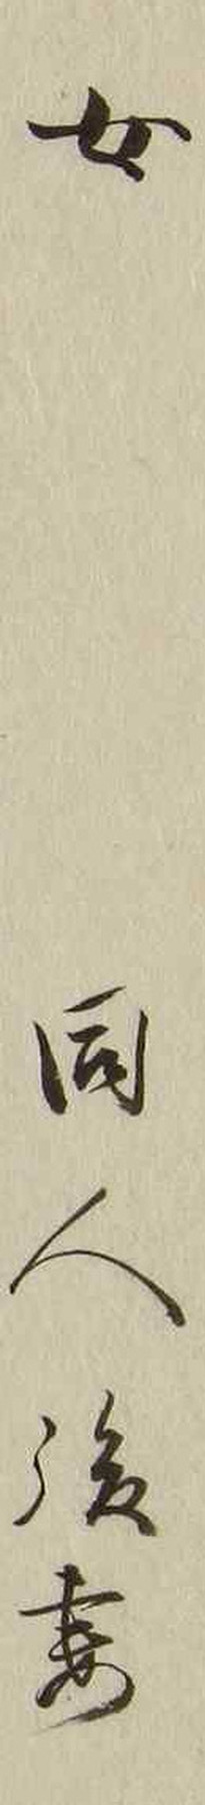女同人後妻
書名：諸士系譜　巻之157　ね之部1
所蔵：会津若松市立会津図書館
